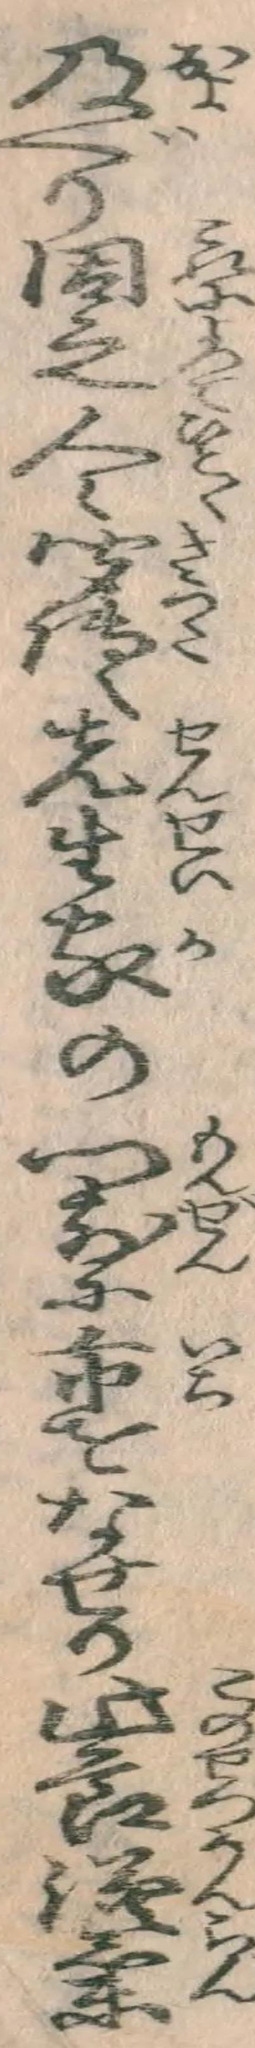及べり因之人々聞伝へ先生家の門前に市をなせり此節漢蘭
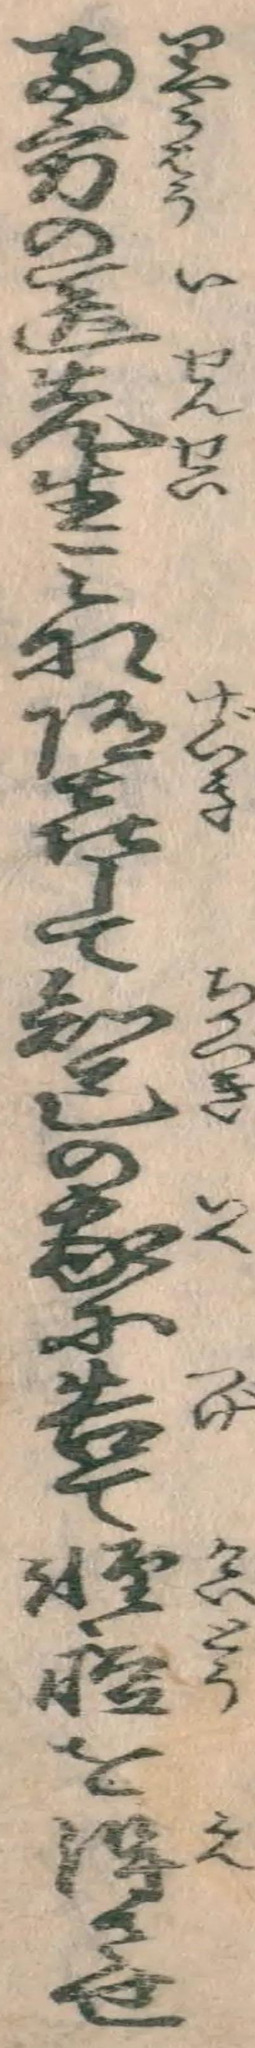両方の医先生みな随喜して知己の家に告て軽痘を得させ

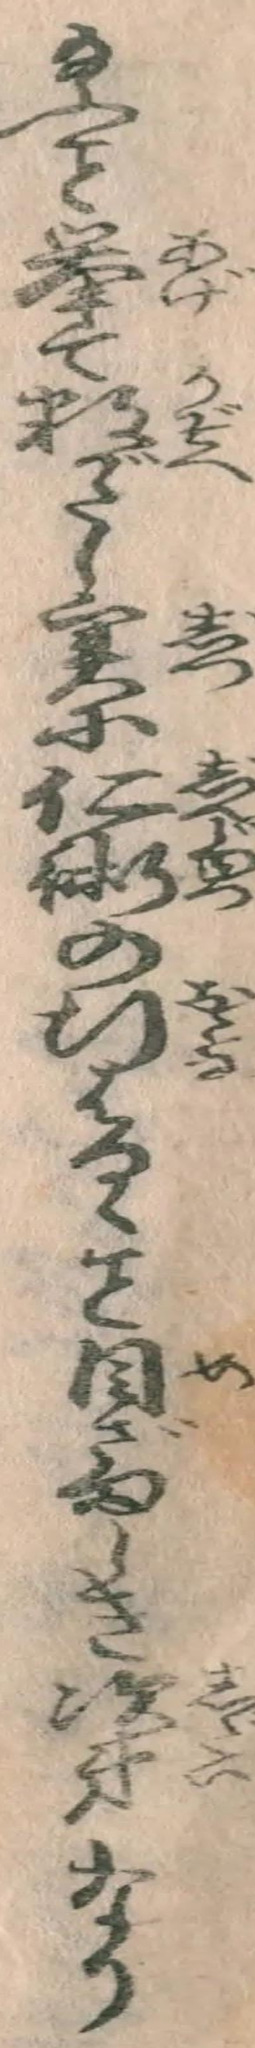給ふこと挙て数がたし実に仁術の行はるゝこと目ざましき次第なり
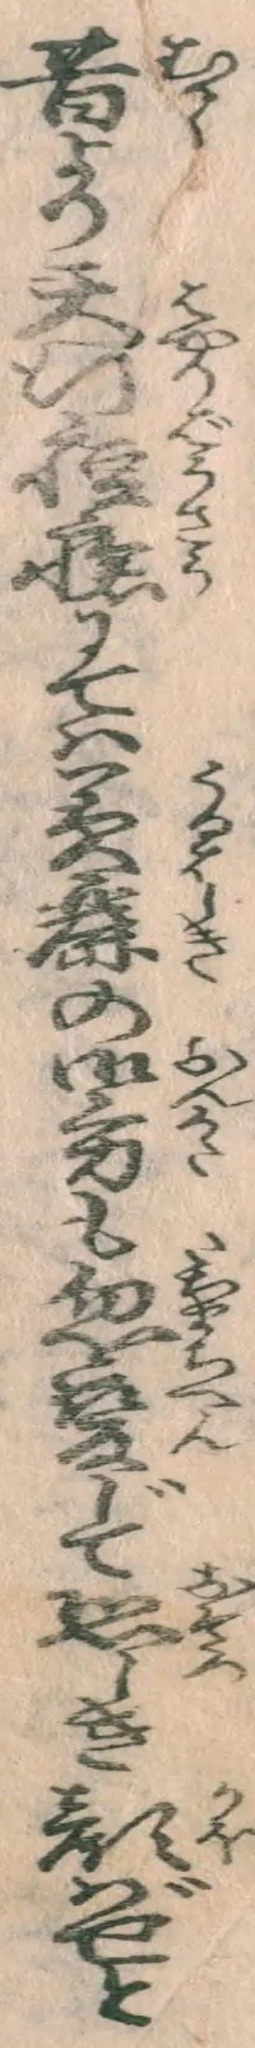昔より天行痘瘡にては美麗の御方も忽変じて恐しき顔ばせと
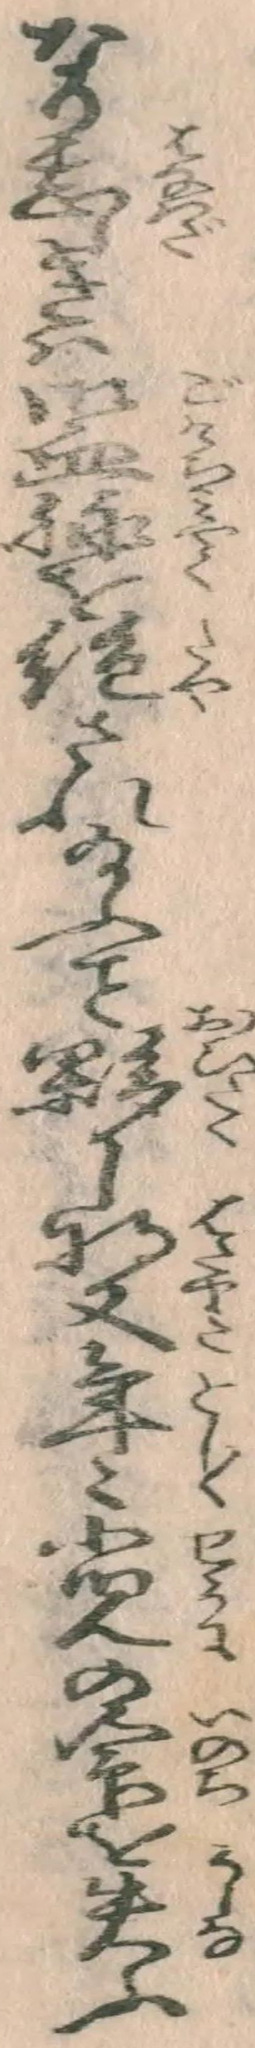なり甚しきは御血脈を絶され給ふこと夥し将又年々小児の命を失ふ
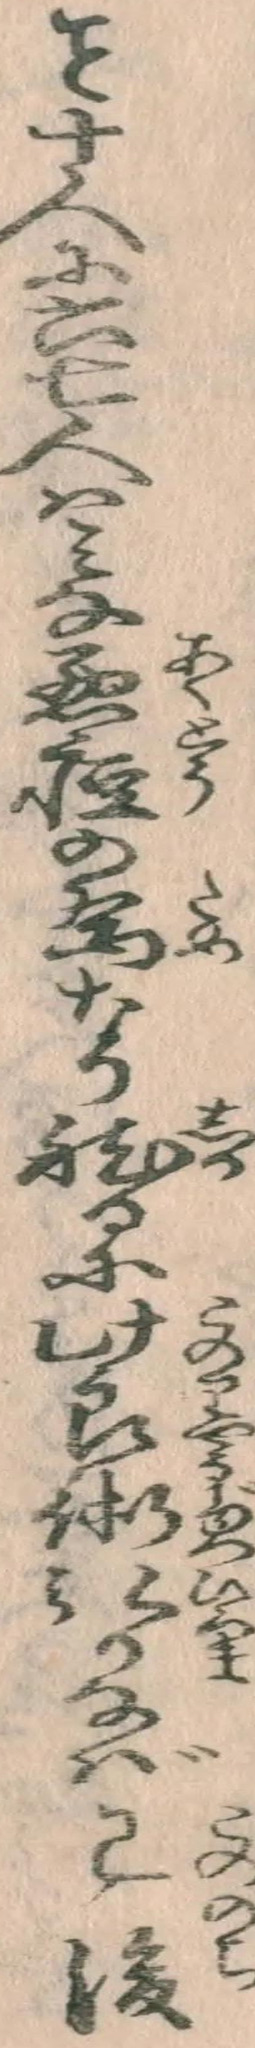こと十人に六七人はみな悪痘の為なり然るに此良術弘りなば已後
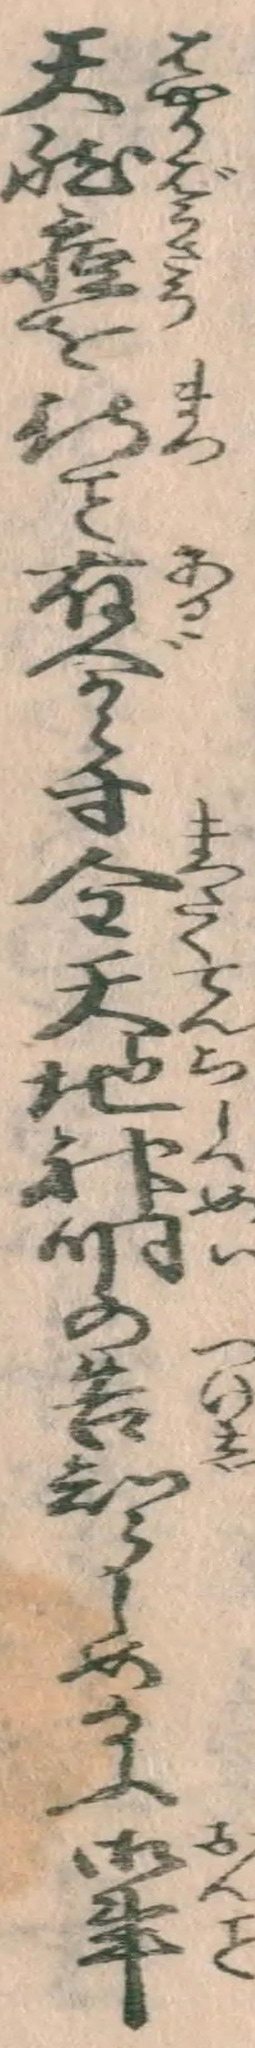天然痘を待こと有べからす全天地神明の告知らしめ給ふ御事
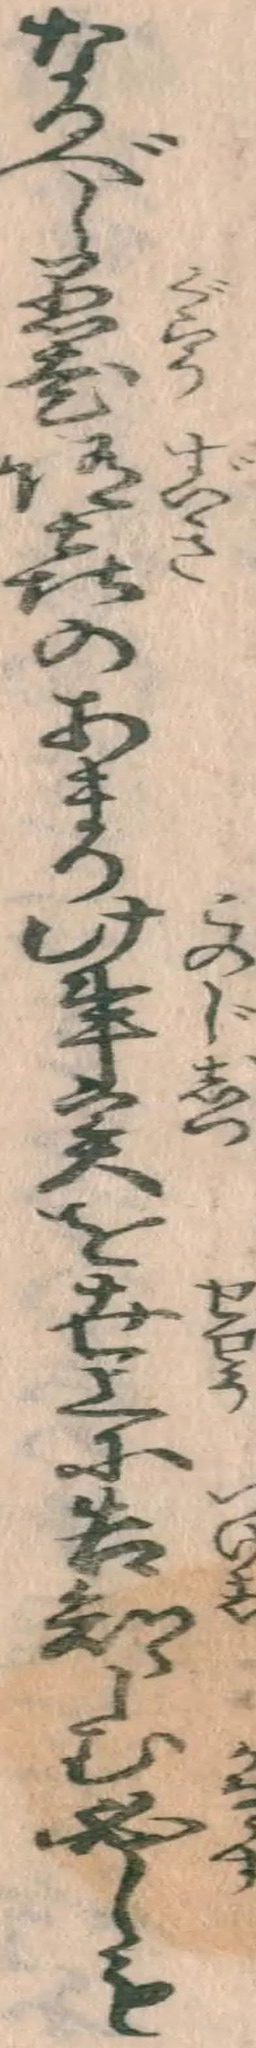なるべし愚老随喜のあまり此事実を世上に告知らしむ必しも
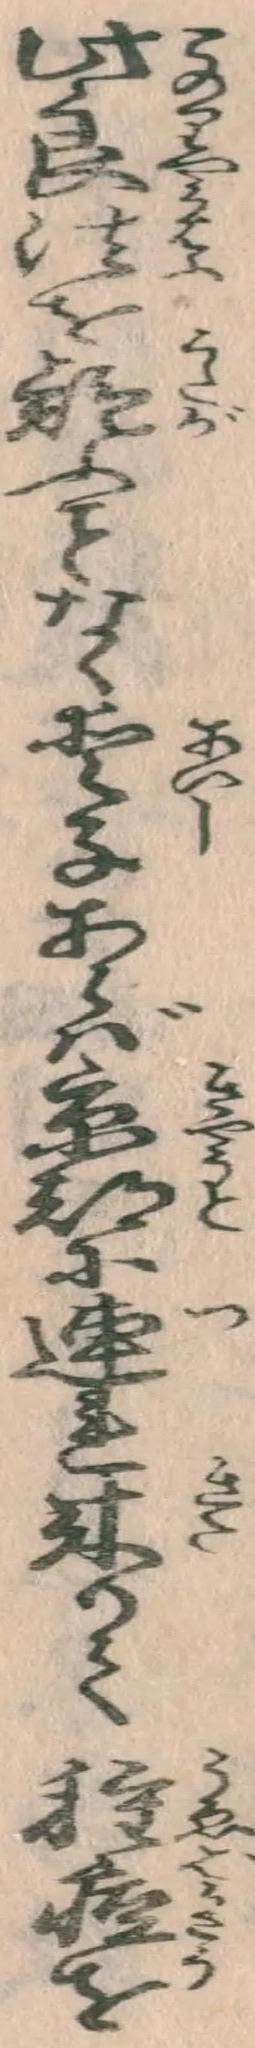此良法を疑ふことなく愛子あらば京都に連れ来りて種痘を
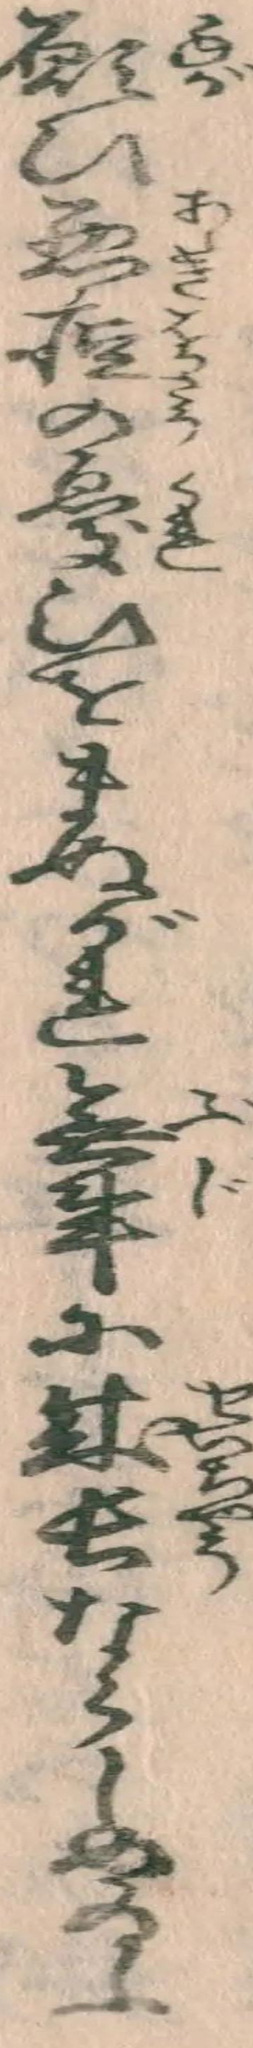願ひ悪痘の憂ひをまぬがれ無事に成長ならしめ給ふ
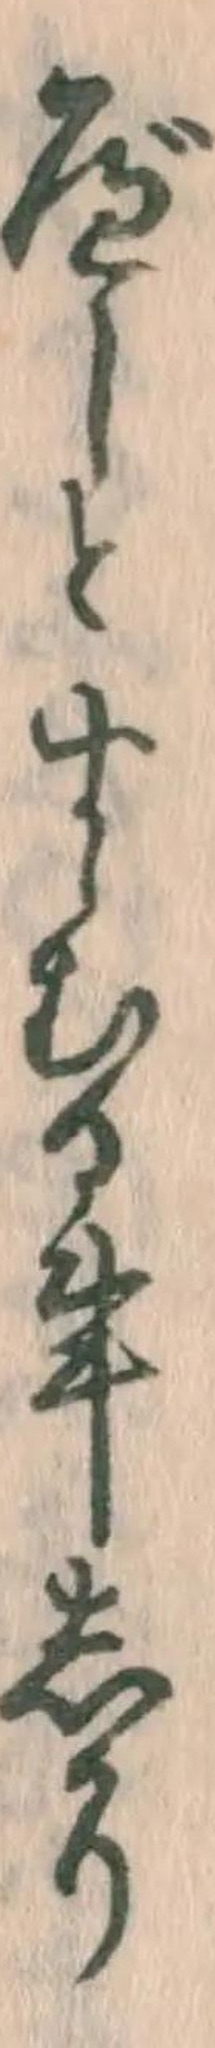べしとすゝむる事しかり
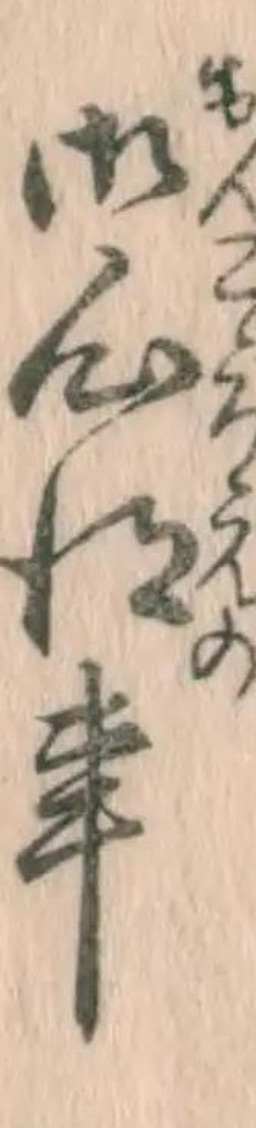御心得事
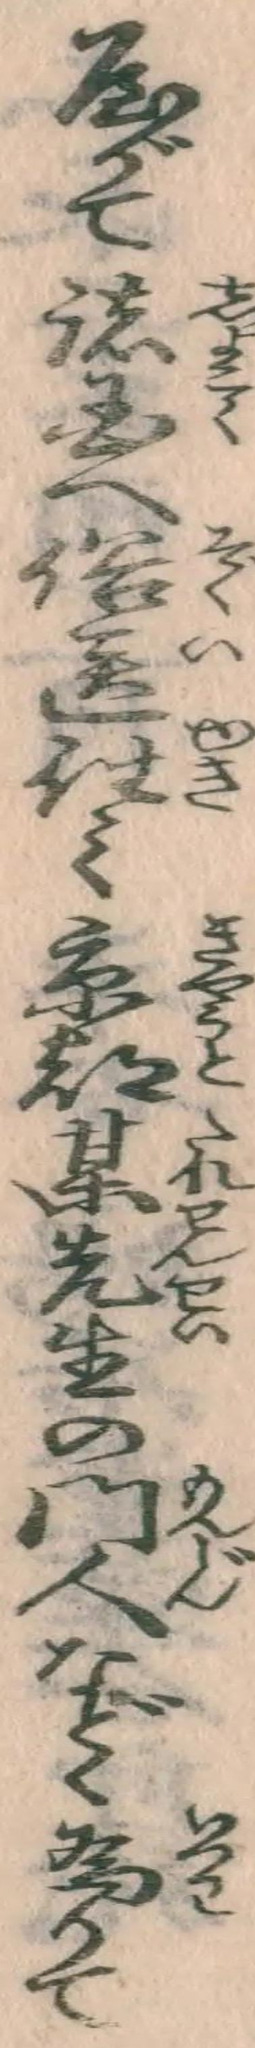やがて諸国へ俗医往て京都某先生の門人などゝ偽りて
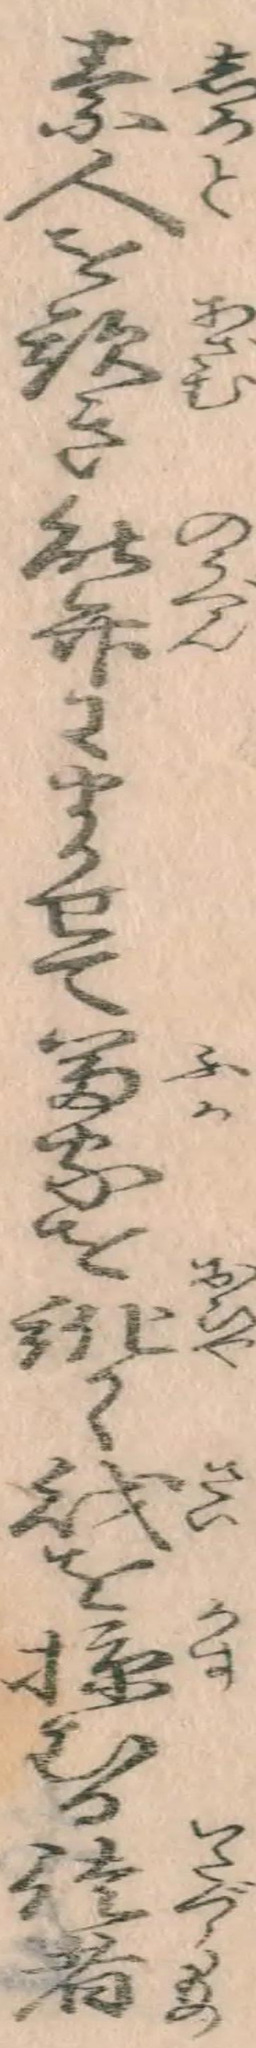素人を欺き能弁にまかせて富家を訛かし財を掠むる徒者
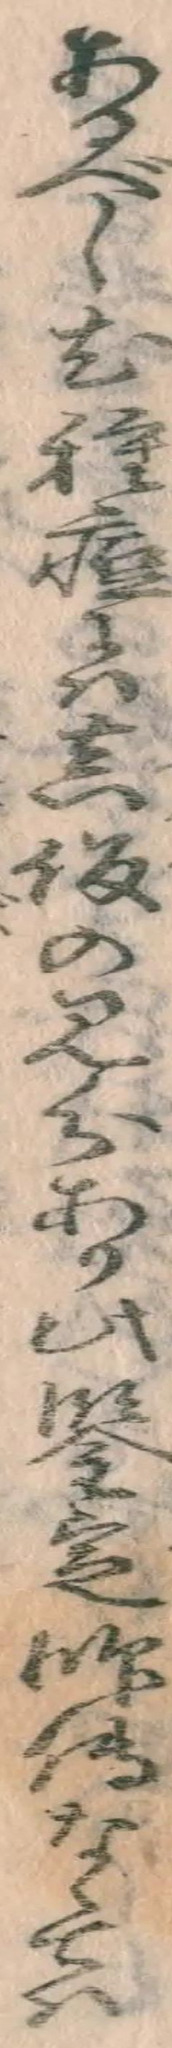あるべし尤種痘には真仮の見分あり此鍳定師伝なくては
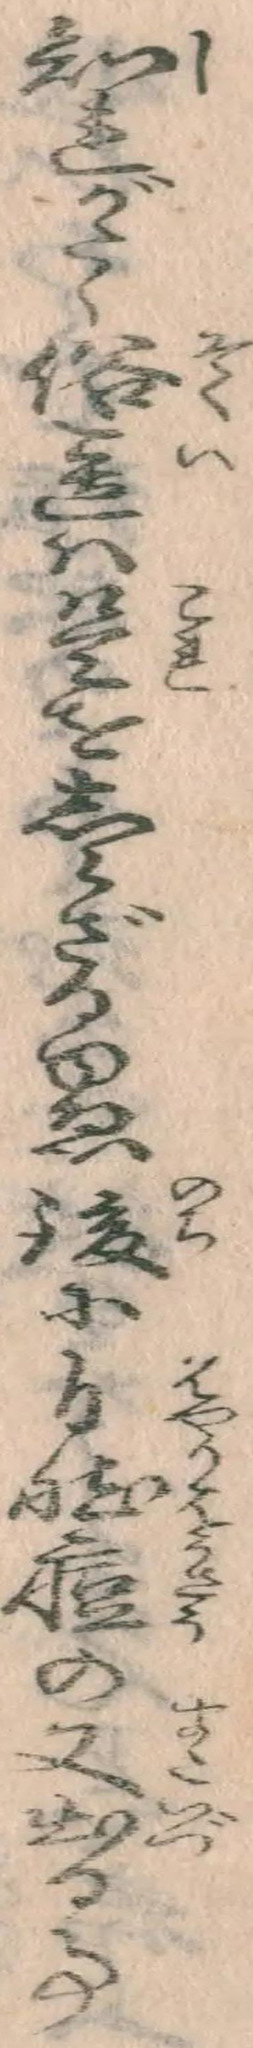知れがたく俗医は是をしらざるゆゑ後に自然痘の又出る事
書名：痘瘡かるくする傳
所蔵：国立国会図書館 National Diet Library, JAPAN
